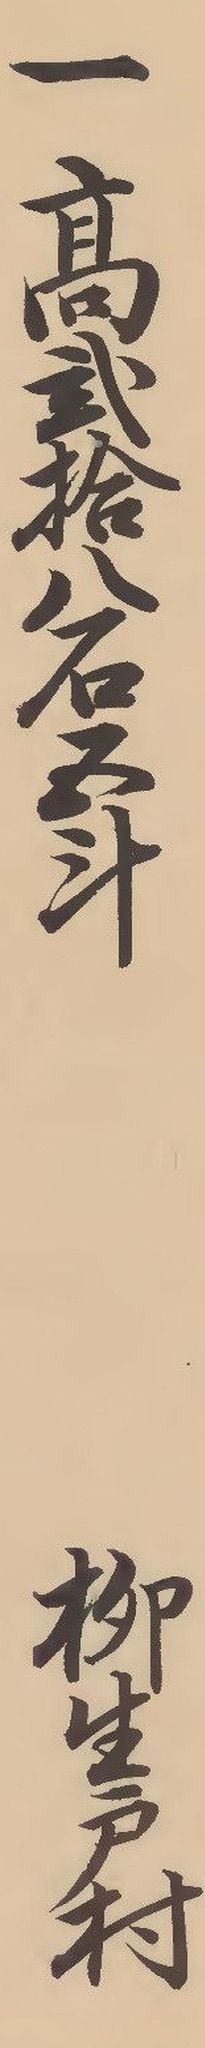一高弐拾八石五斗柳生戸村
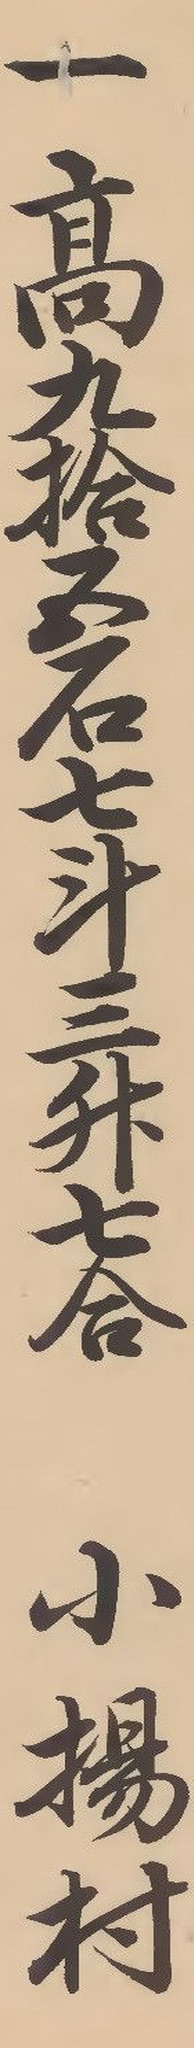一高九拾五石七斗三升七合小揚村
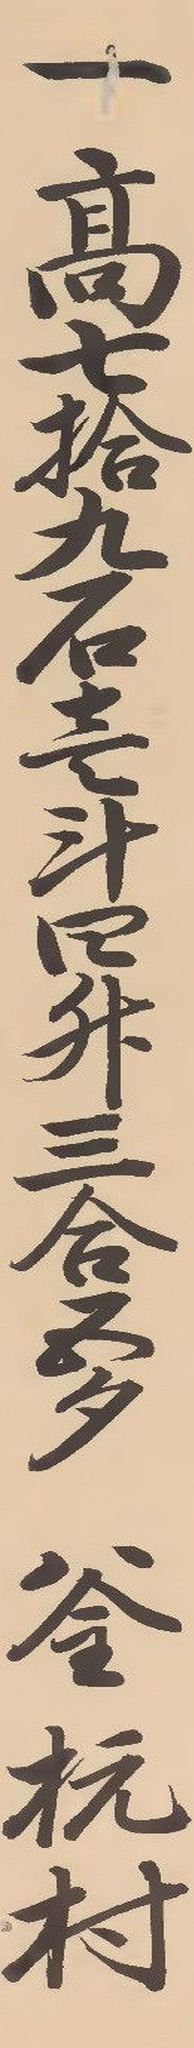一高七拾九石壱斗四升三合五勺釜杭村
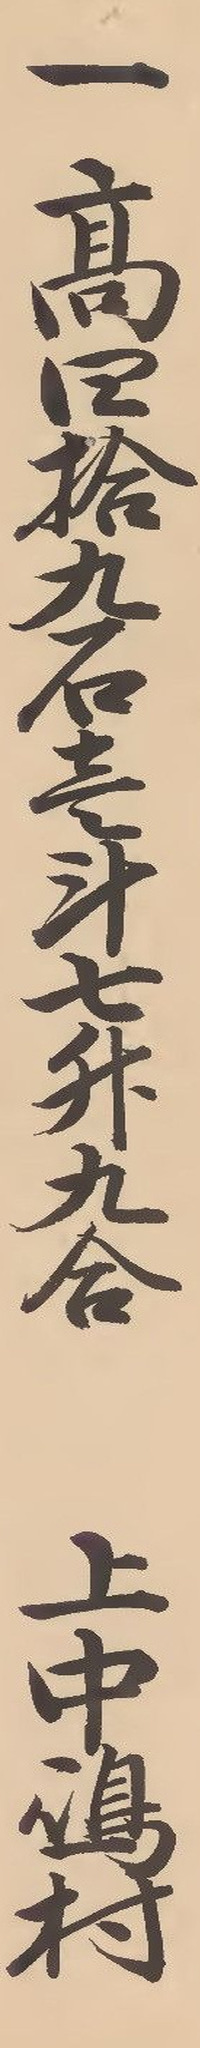一高四拾九石壱斗七升九合上中島村
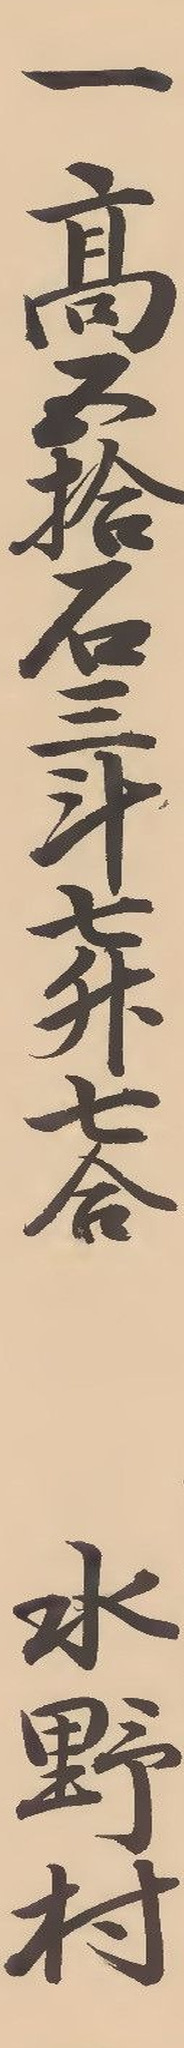一高五拾石三斗七升七合水野村
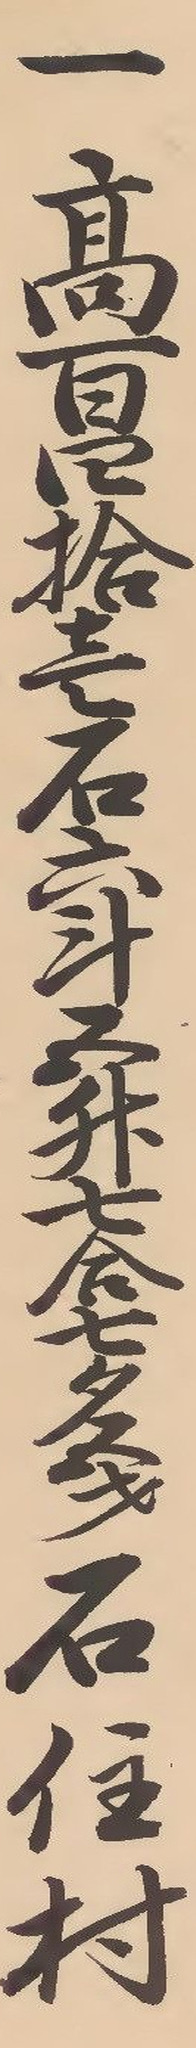一高百四拾壱石六斗五升七合七勺五才石住村

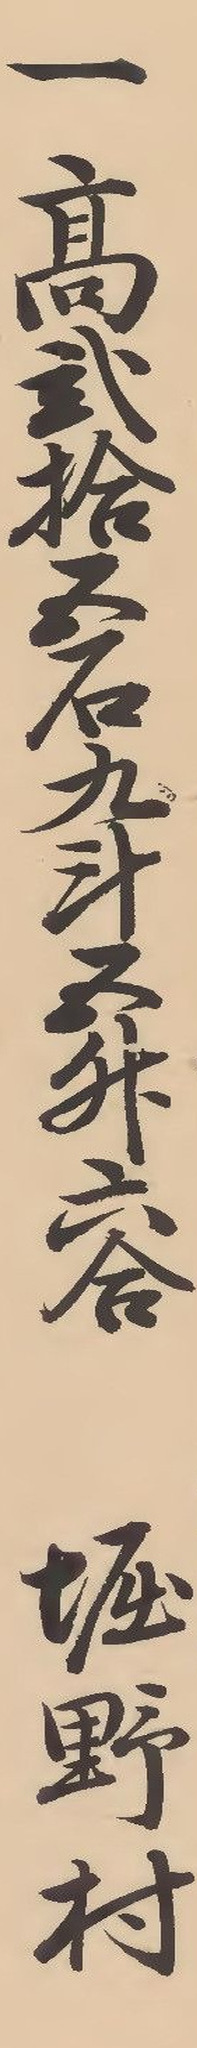一高弐拾五石九斗五升六合堀野村
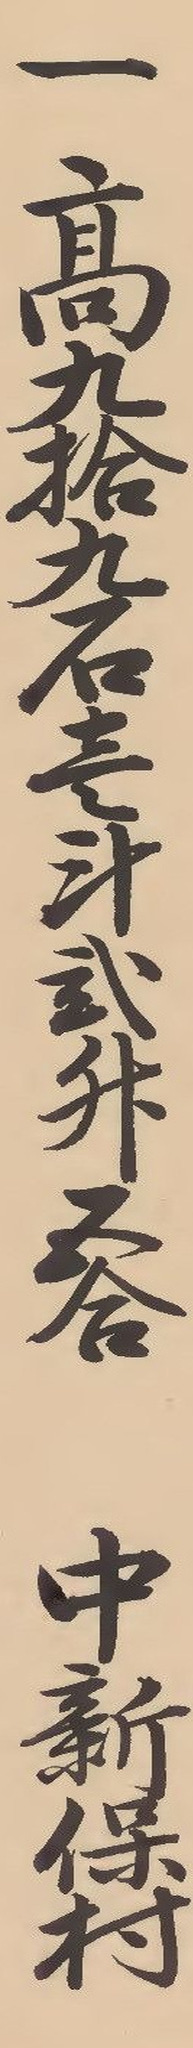一高九拾九石壱斗弐升五合中新保村
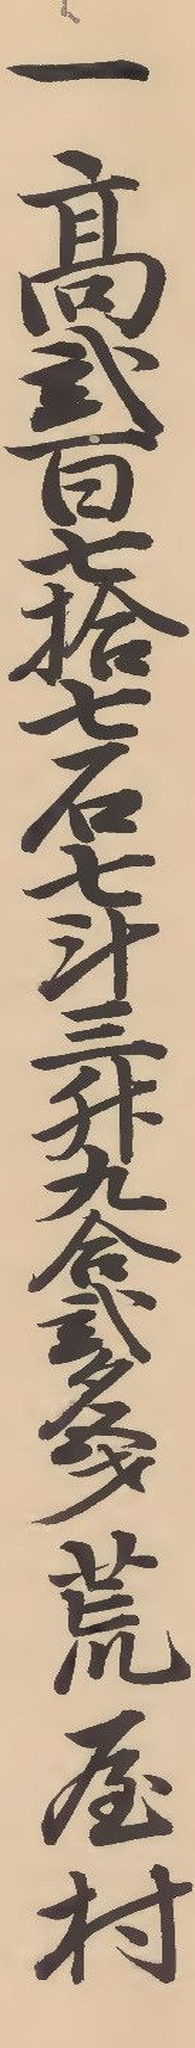一高弐百七拾七石七斗三升九合弐勺五才荒屋村
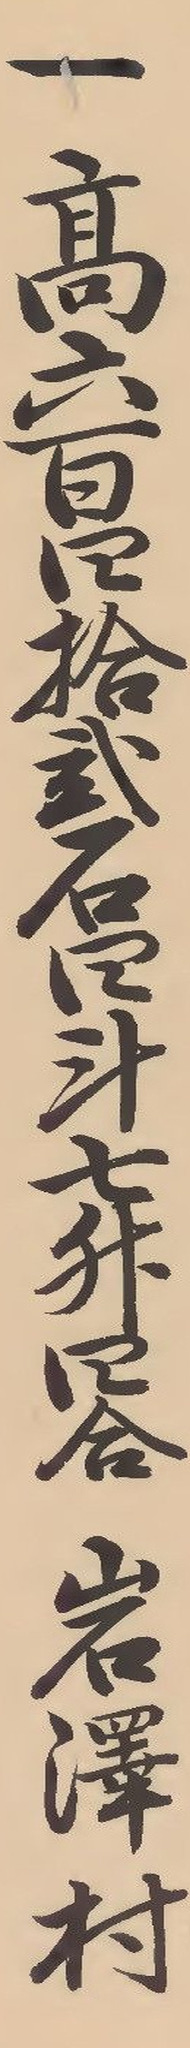一高六百四拾弐石四斗七升四合岩沢村
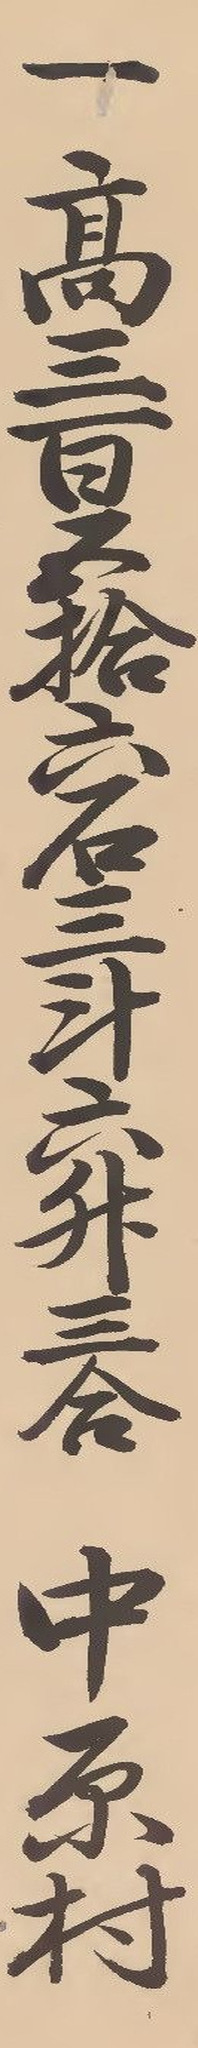一高三百五拾六石三斗六升三合中原村
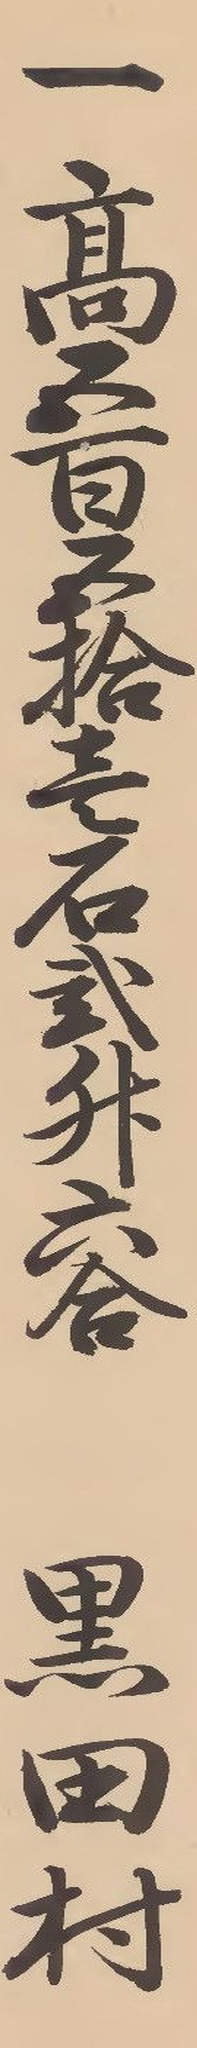一高五百五拾壱石弐升六合黒田村
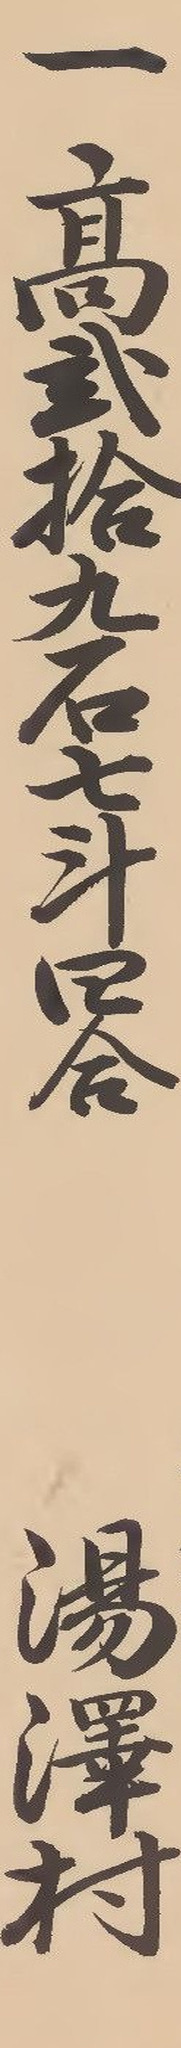一高弐拾九石七斗四合湯沢村
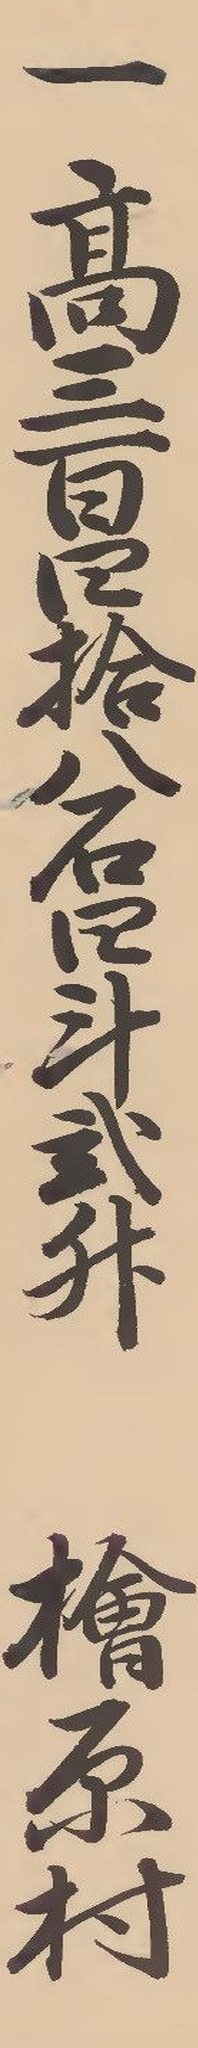一高三百四拾八石四斗弐升桧原村

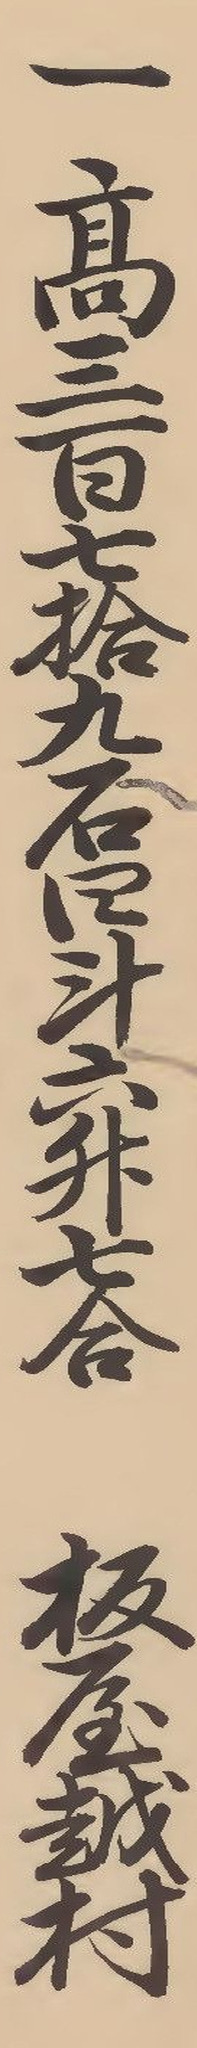一高三百七拾九石四斗六升七合板屋越村
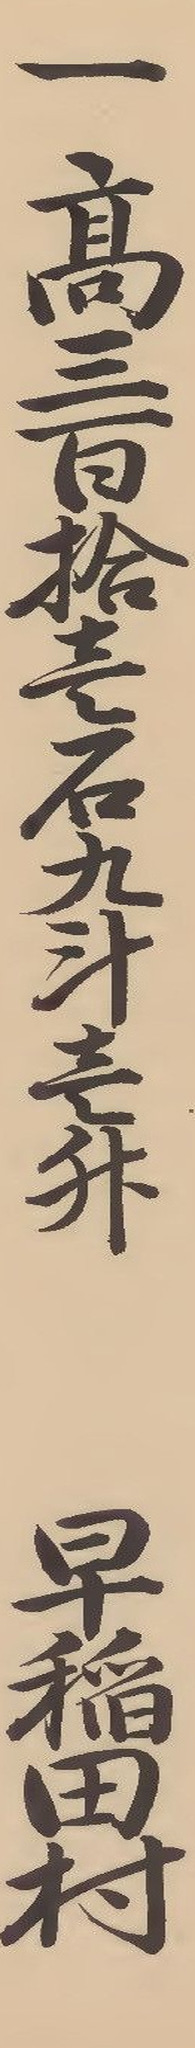一高三百拾壱石九斗壱升早稲田村
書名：越後国郷帳　下
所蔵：国立公文書館 National Archives of Japan
